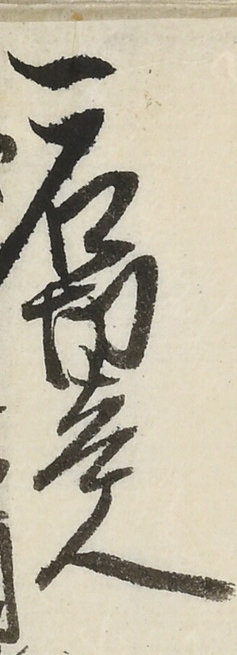一石切壱人
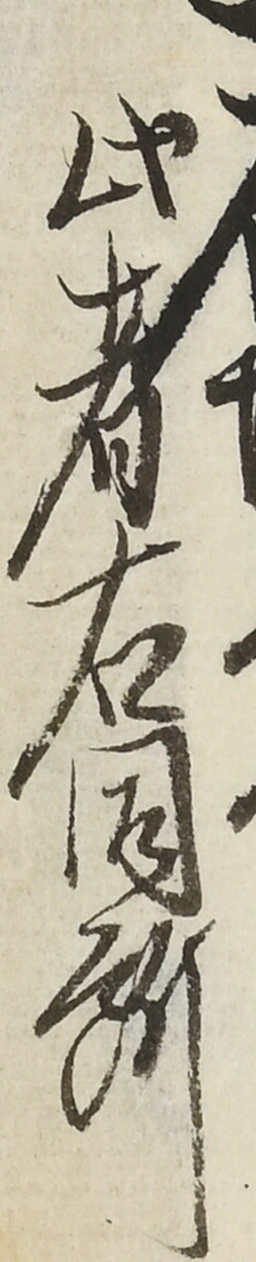此者右同所

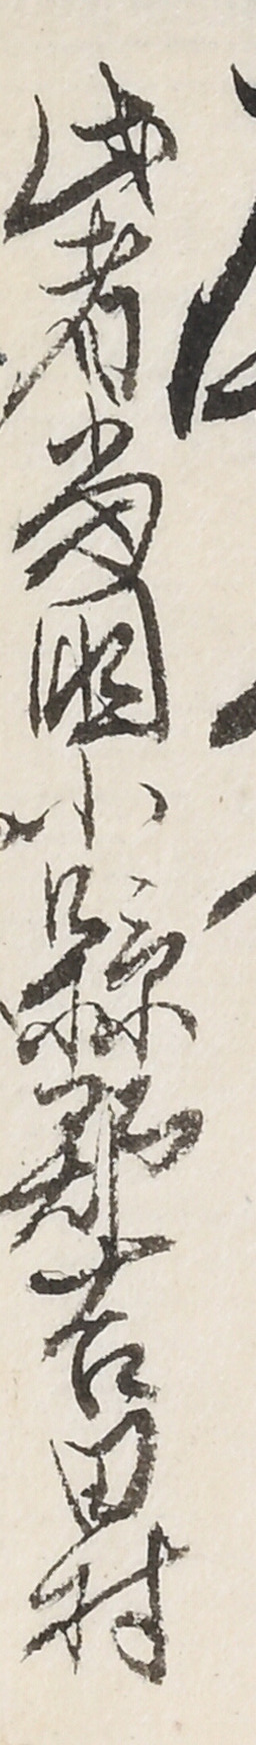此者当国小県郡吉田村
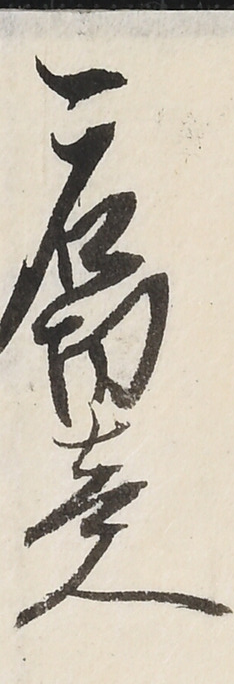一石切壱人
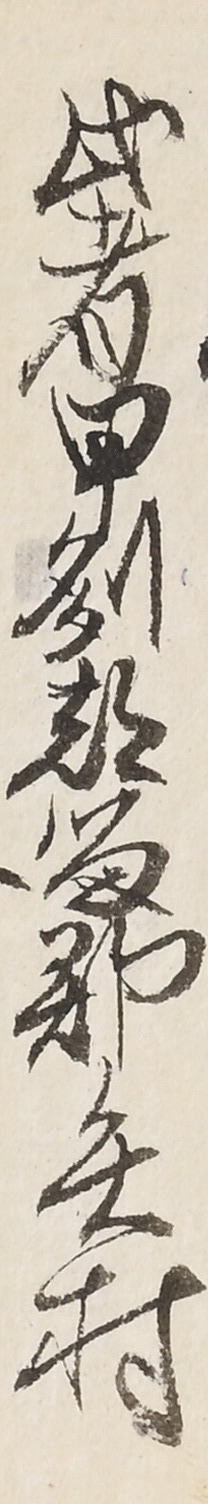此者甲州都留郡矢村
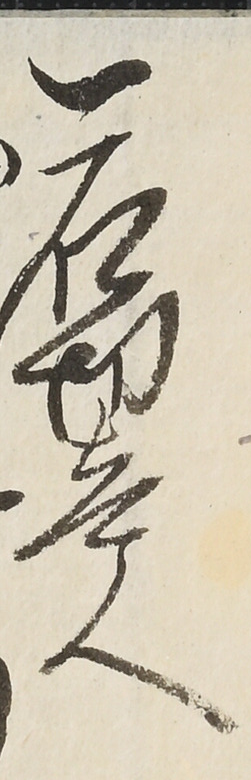一石切壱人
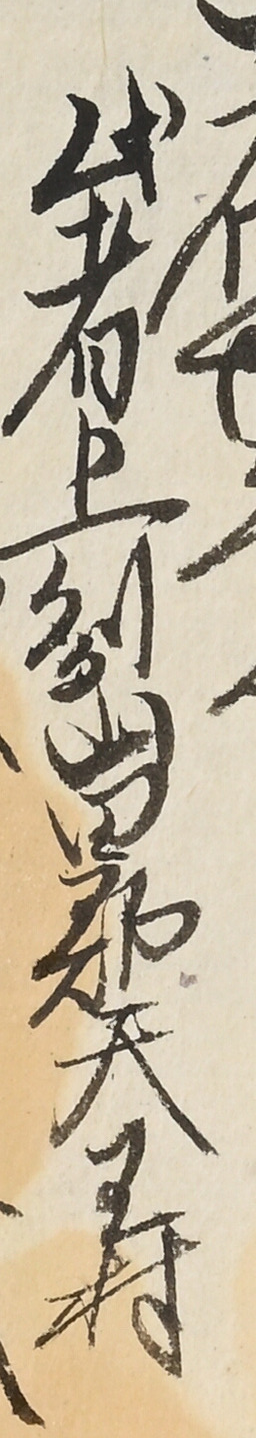此者上州山田郡天王村
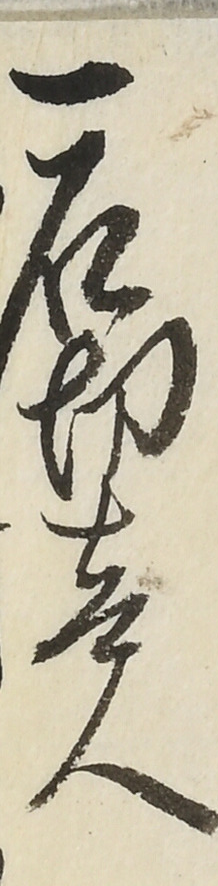一石切壱人
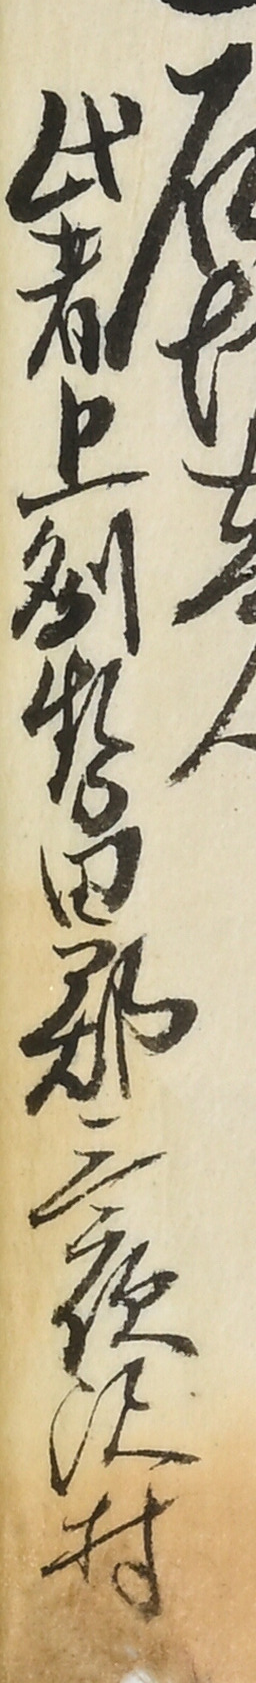此者上州勢田郡三夜沢村
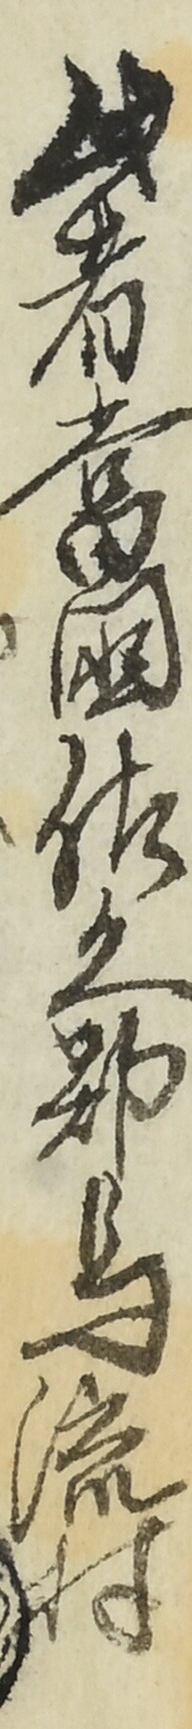此者当国小県郡吉田村

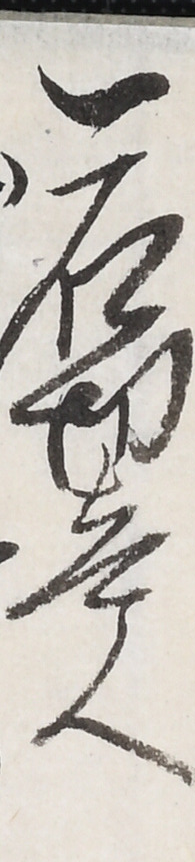一石切壱人
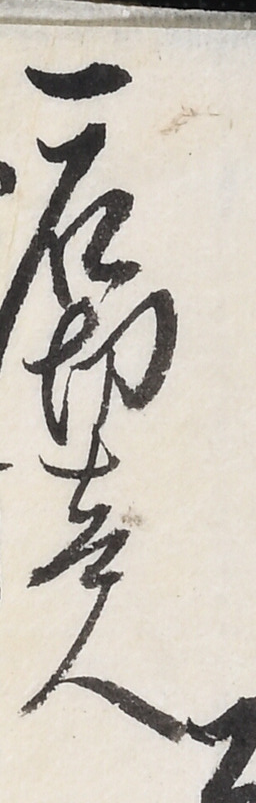一石切壱人
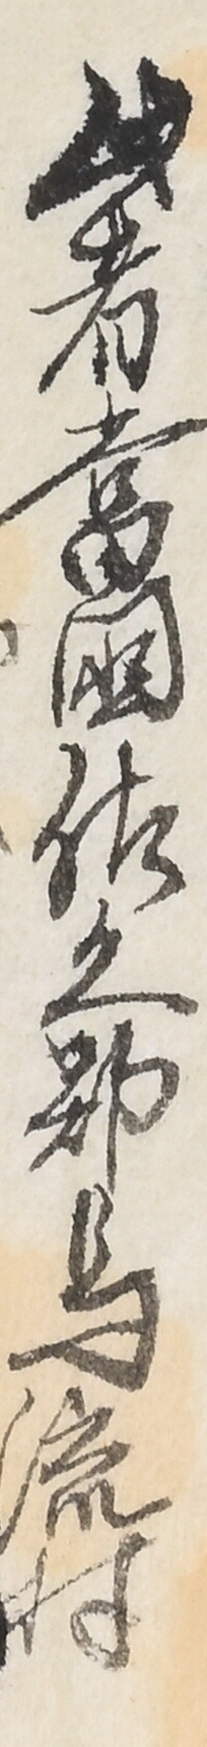此者当国佐久郡馬流村
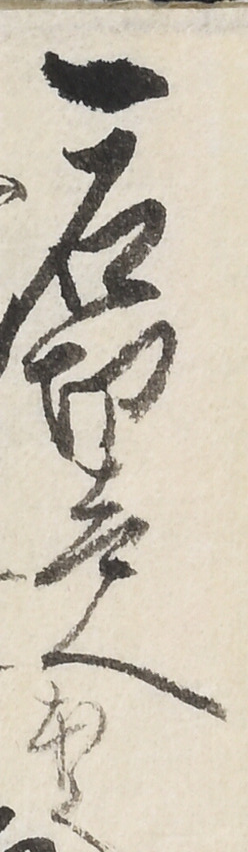一石切壱人
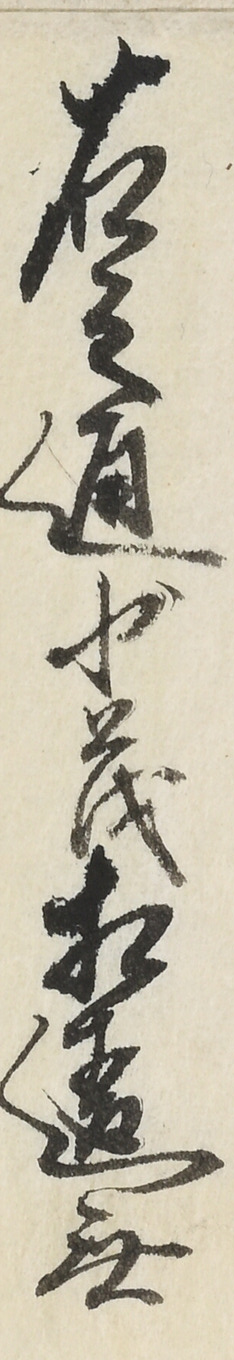右之通少も相違無
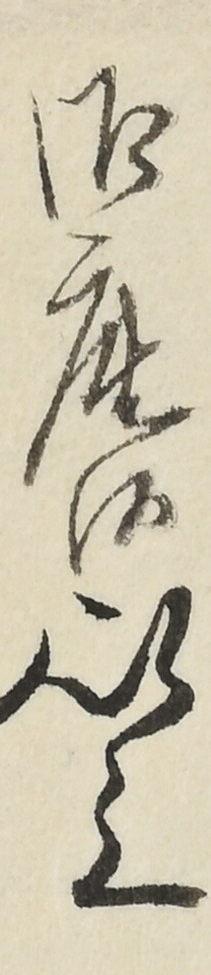御座候以上
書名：文久四甲子年二月石切名前書上帳
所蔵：伊那市立高遠町図書館・合同会社AMANE
